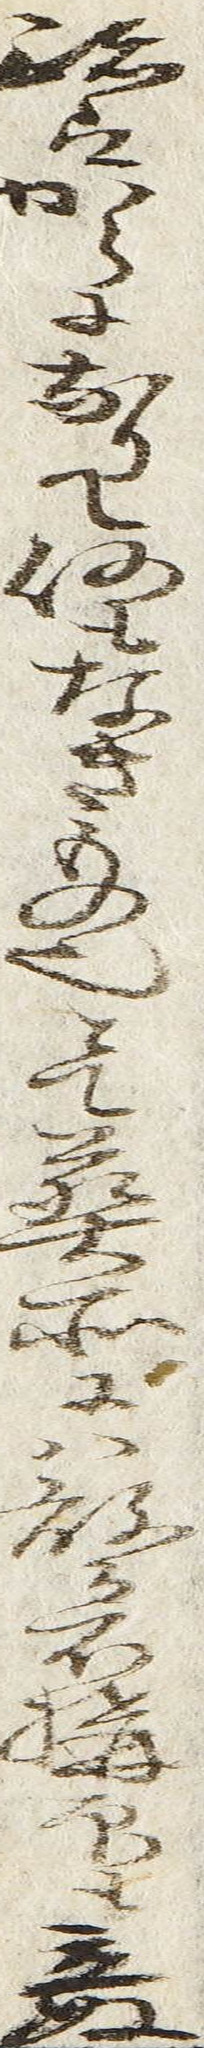跡はからになりて何もなきもの也とて葬所には放而不構印も立ぬ
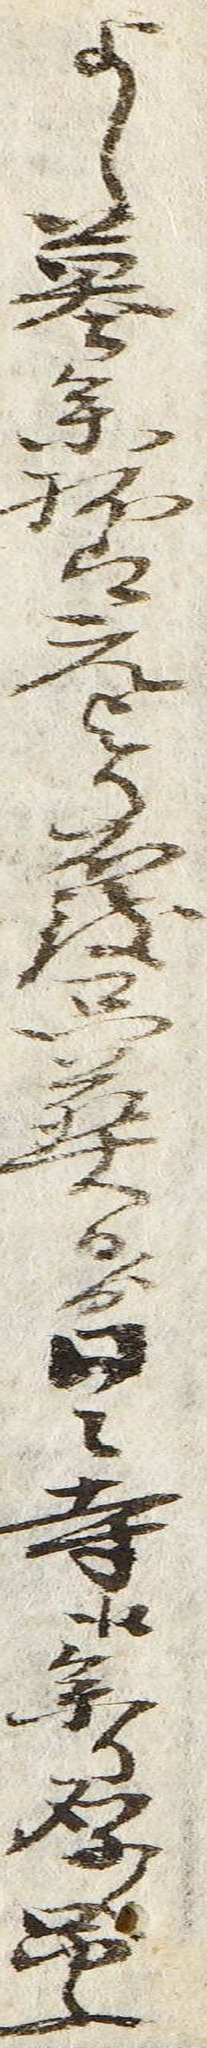よし墓参抔は元より不致只葬日ゟ日々寺江参り厚く弔ふ
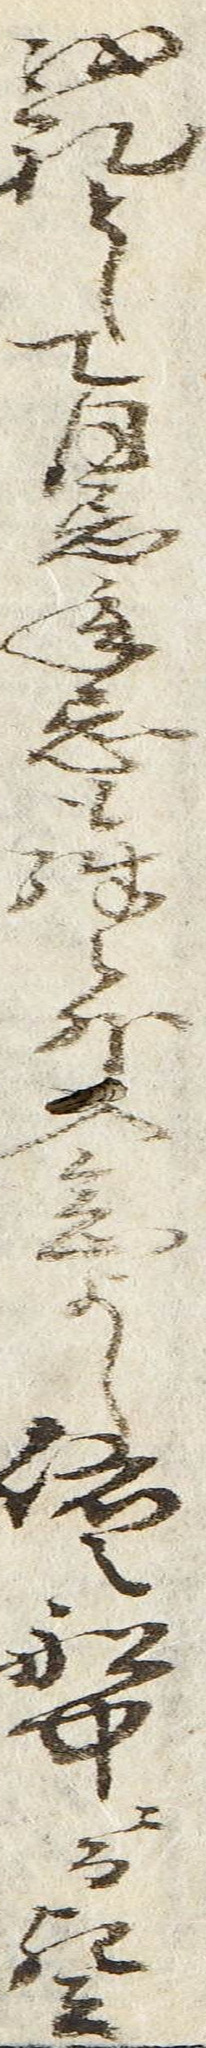を礼として月忌年忌も殊之外入念よし依之船中に而死去
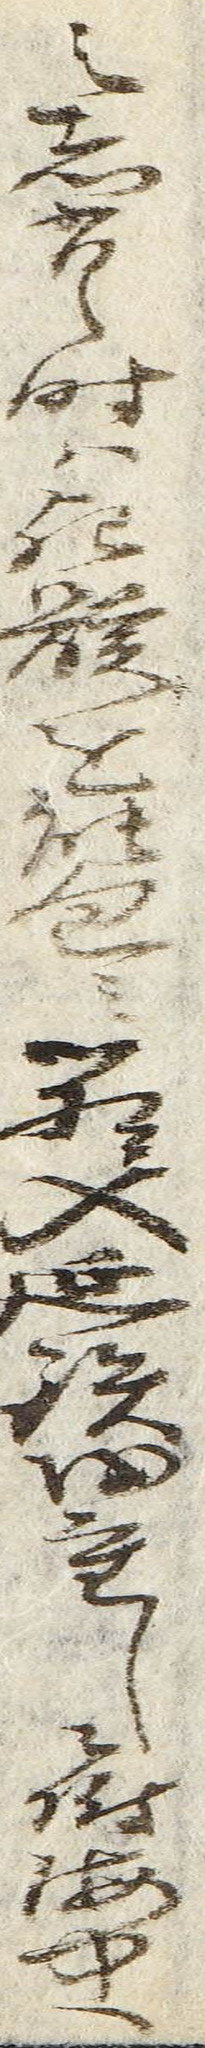之者有之時は死骸を能包み箱に入延鉄を重しに附海中へ
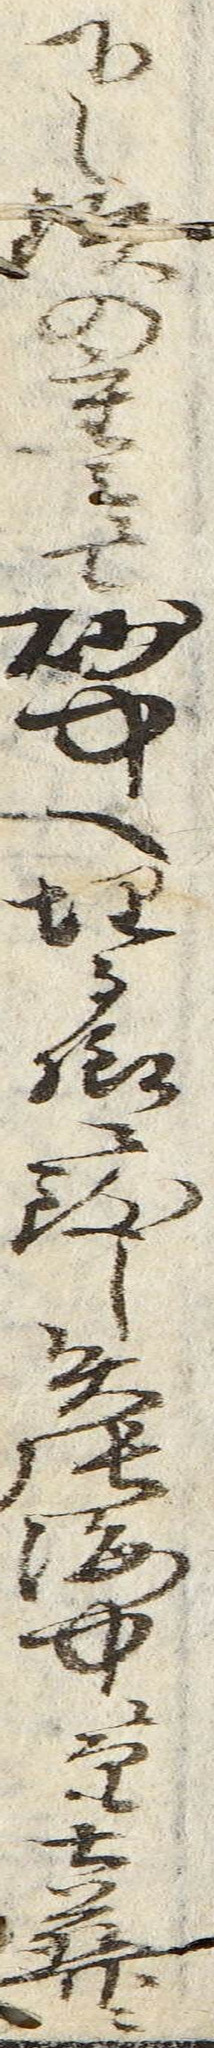下し鉄の重みにて砂中へ埋る様に致し矢張海中に而も土葬に

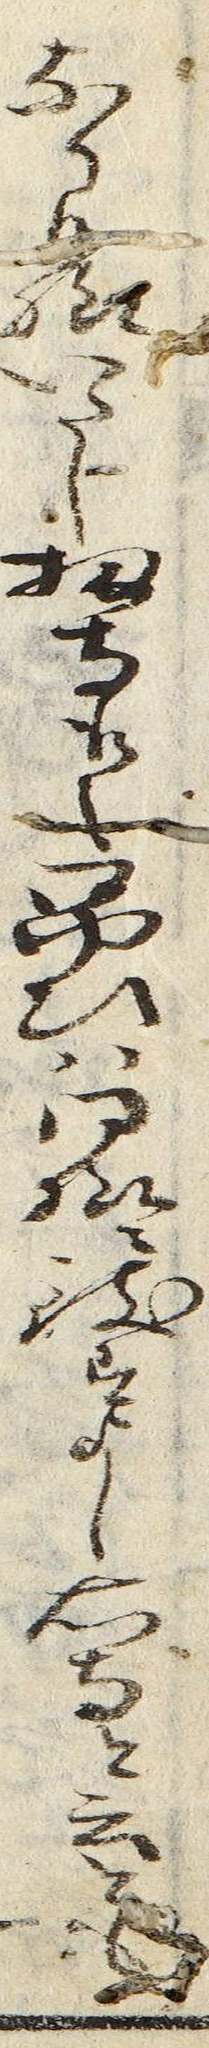なり候様いたし扨寺江之弔ひは同様に致すよし右寺と云とも
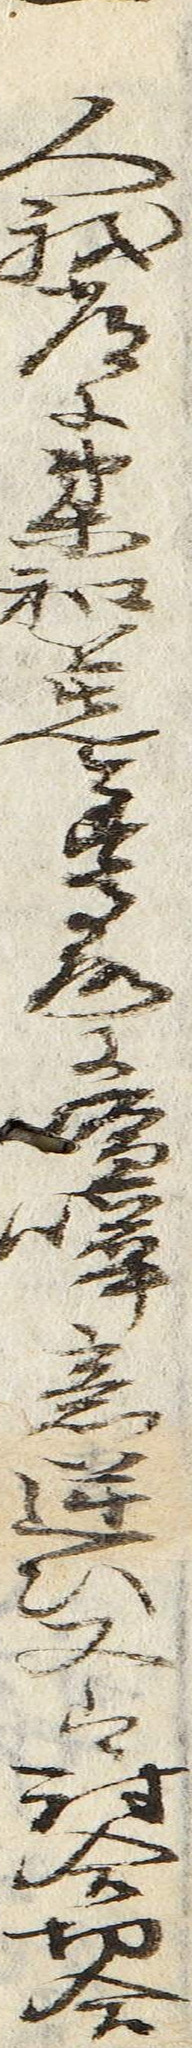一人我常に柔和を先とする故に喧嘩意逆ひ又は討合切合
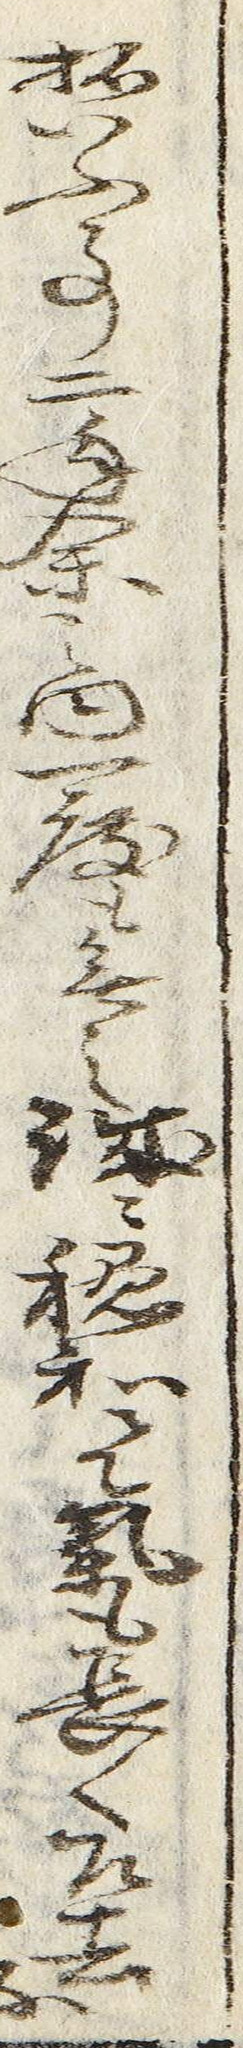抔いふ事二年余之内一度も無之誠に温和にて気も長く乍去な
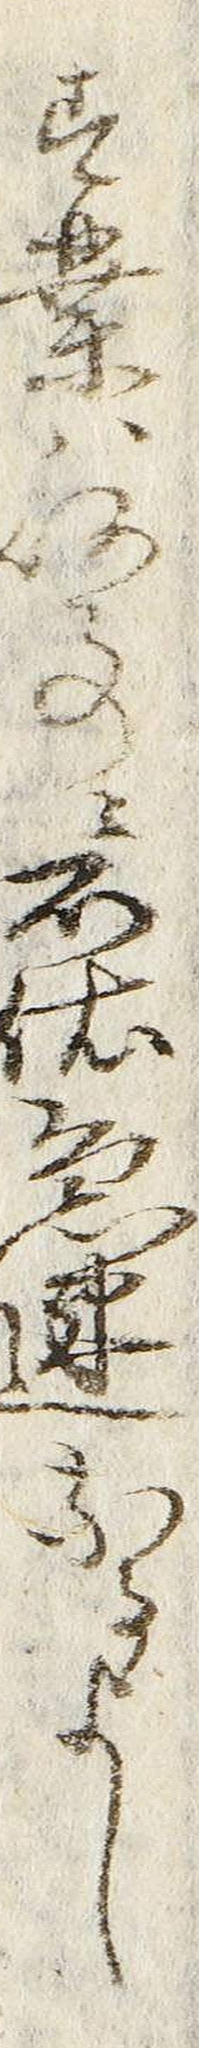す業は何事に不依急速なるよし
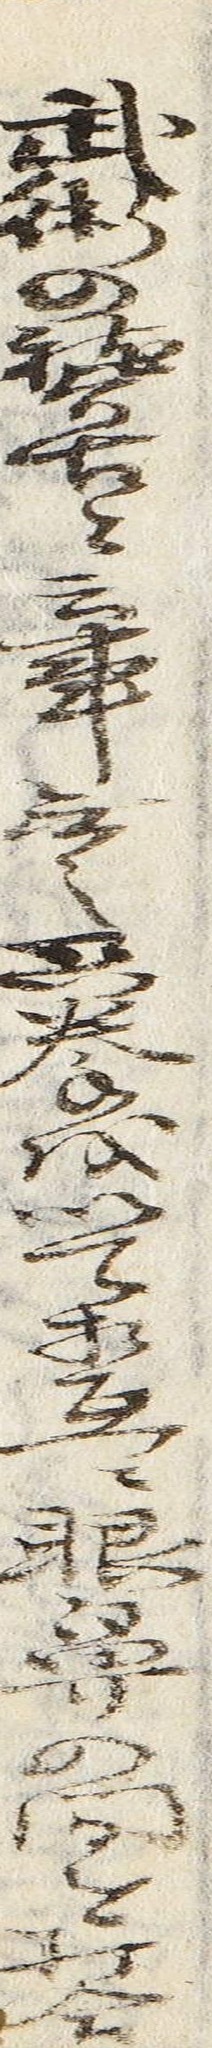一武術の稽古と云事無之只拳を以て相互に眼鼻の間を打合
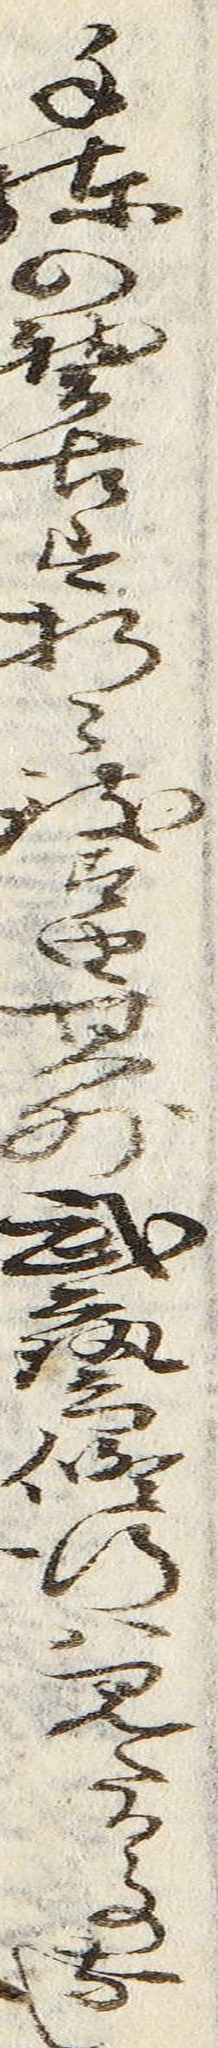手練の稽古は折々致す由其外武芸修行は見たる事なし
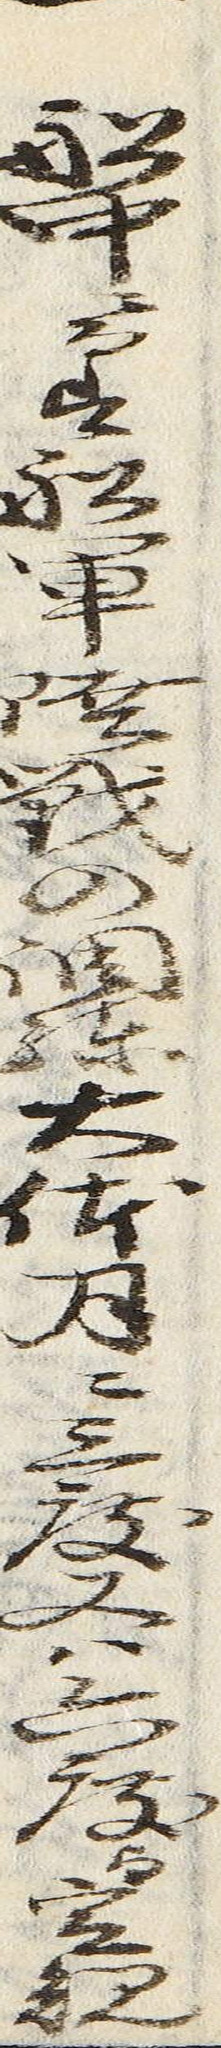一船中に而は船軍陸戦の調練大体月に三度又は六度と定規
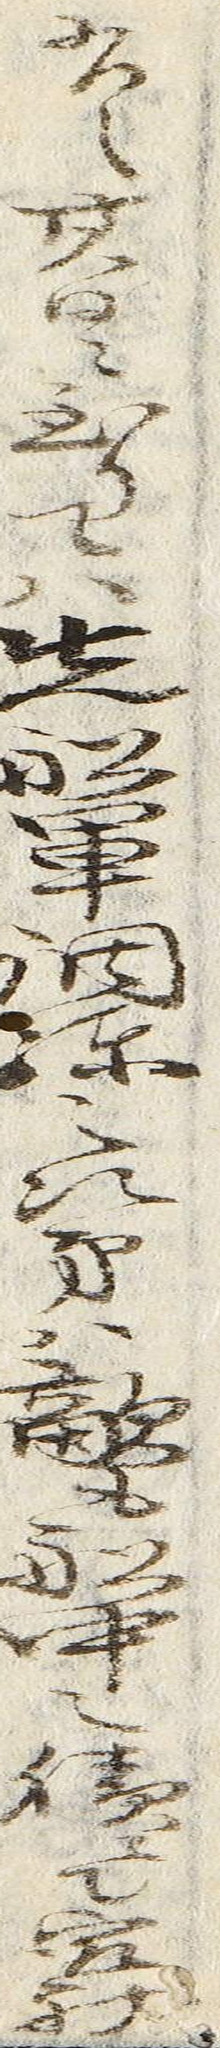有之其日に至りては先船軍調練之次第は敵も船中之積にて最初
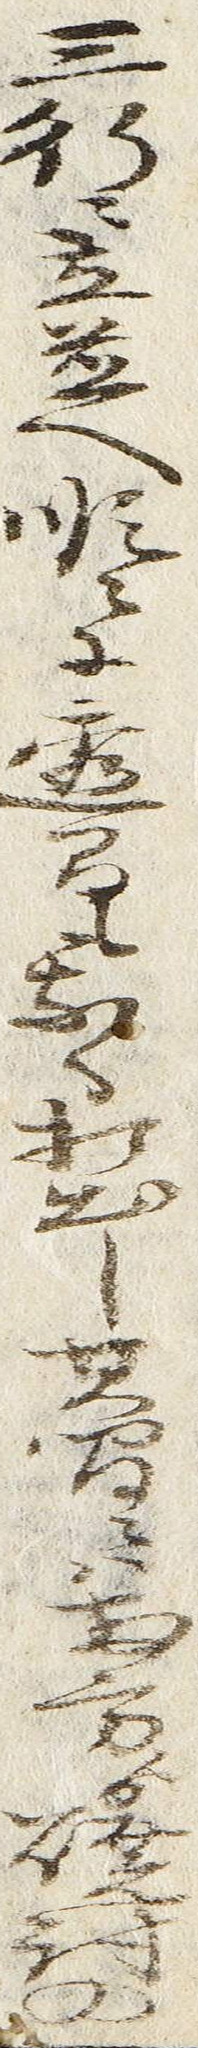三行に立並へ順々に透間もなく打出し其間には両方ゟ焼討の
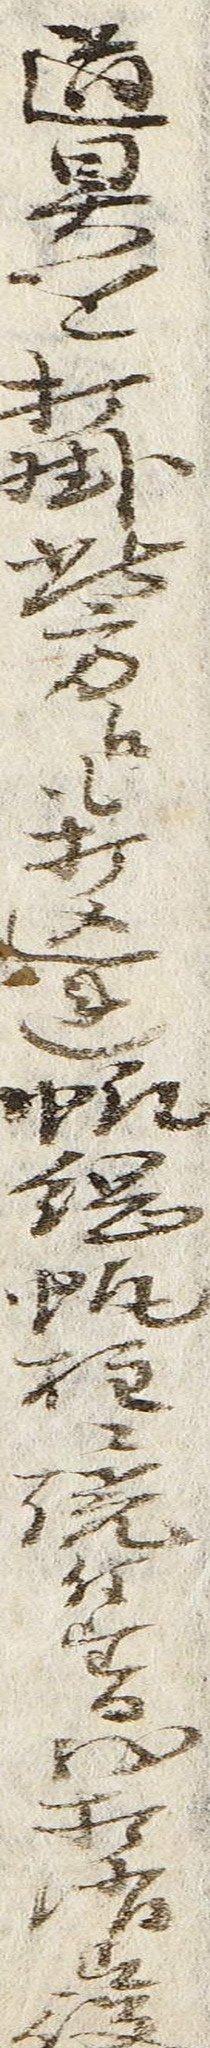道具を打掛此方江も打込れ帆綱帆柱に焼付たるを打消す役
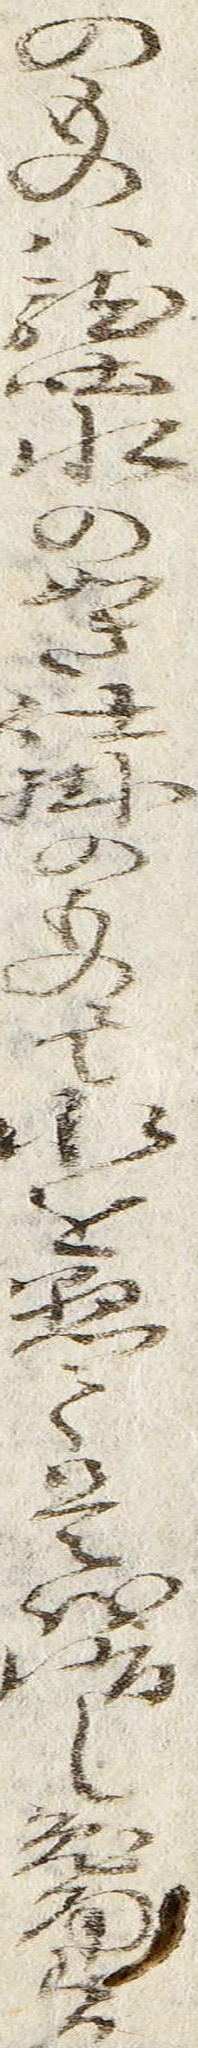のものは竜吐水の如き仕掛のものにて水を懸て是を消し兎角する
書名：漂流夢物語
